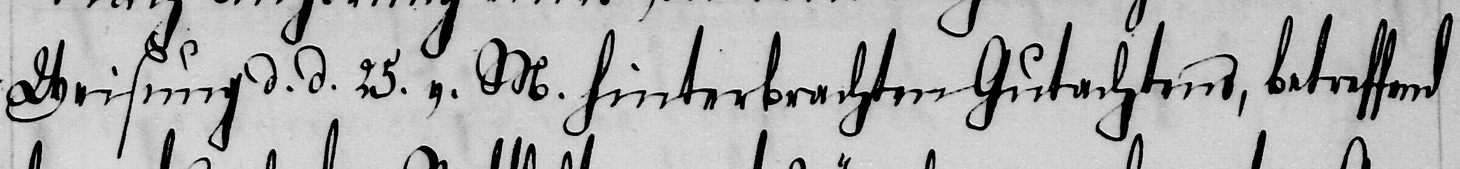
Weisung d. d. 25. v. M. hinterbrachten Gutachtens, betreffend
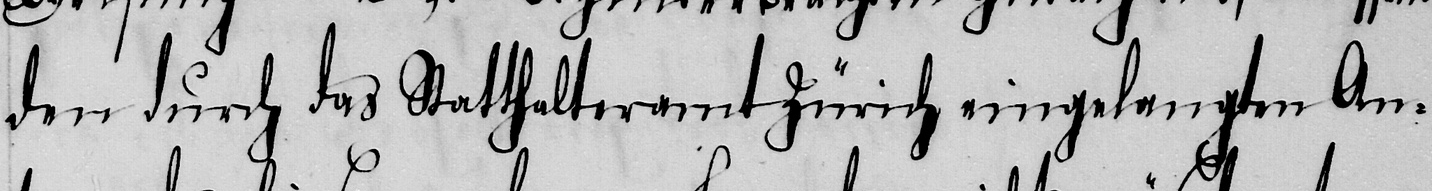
den durch das Statthalteramt Zürich eingelangten Ant¬
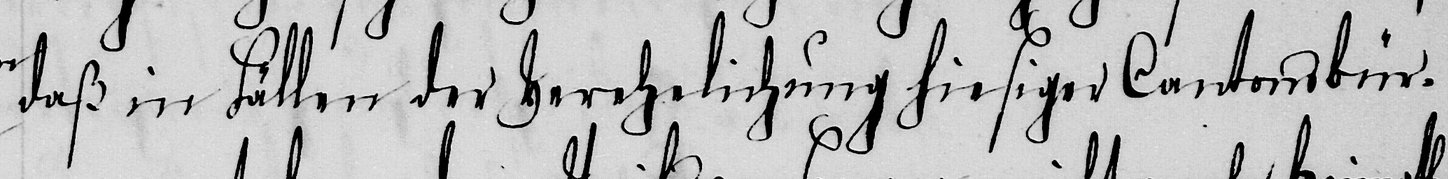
daß in Fällen der Verehelichung hiesiger Cantonsbür¬
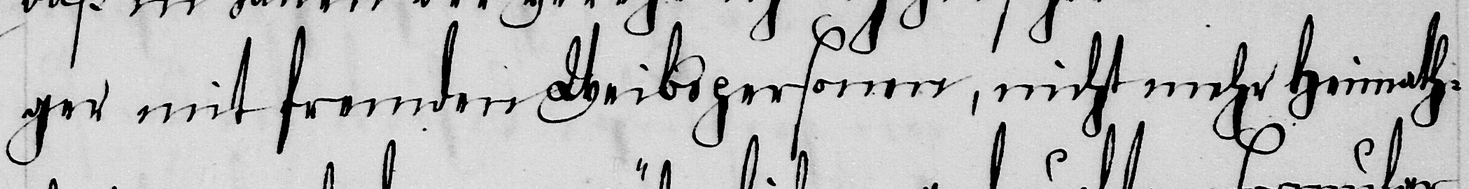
ger mit fremden Weibspersonen, nicht mehr Heimath¬
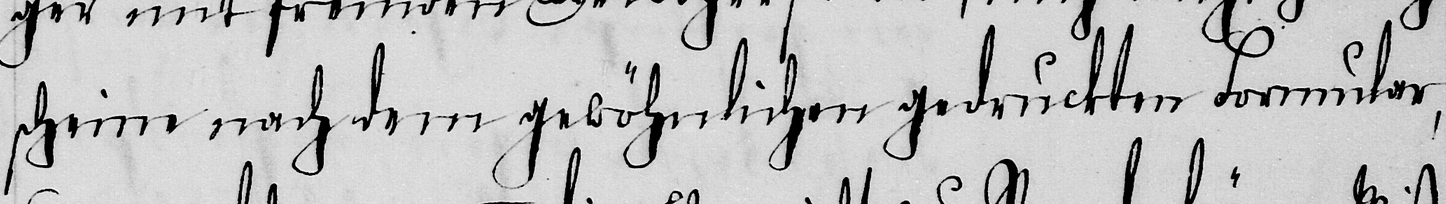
scheine nach dem gewöhnlichen gedruckten Formular,
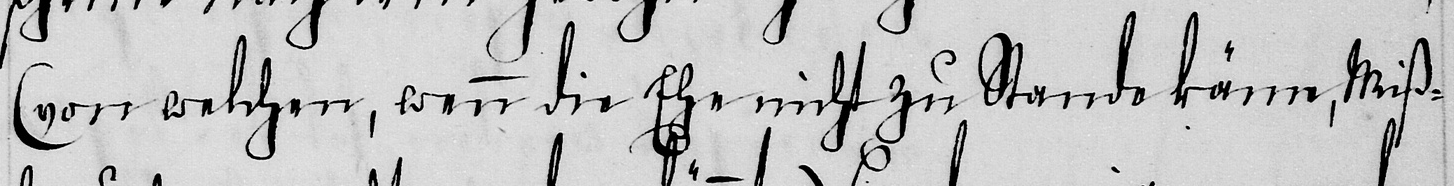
(von welchem, wenn die Ehe nicht zu Stande käme, Miß¬
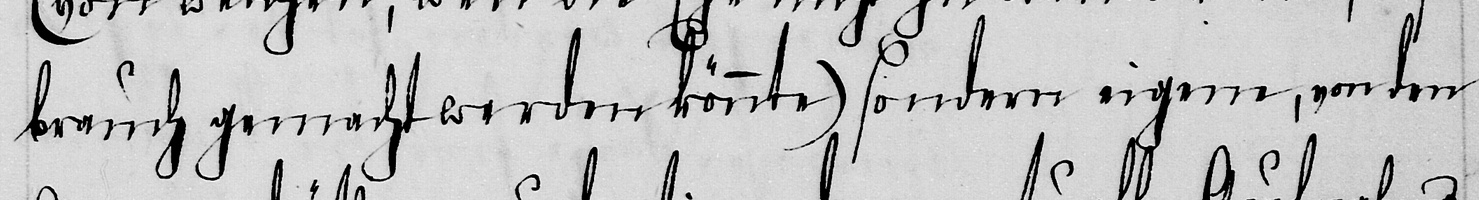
brauch gemacht werden könnte) sondern eigene, von den
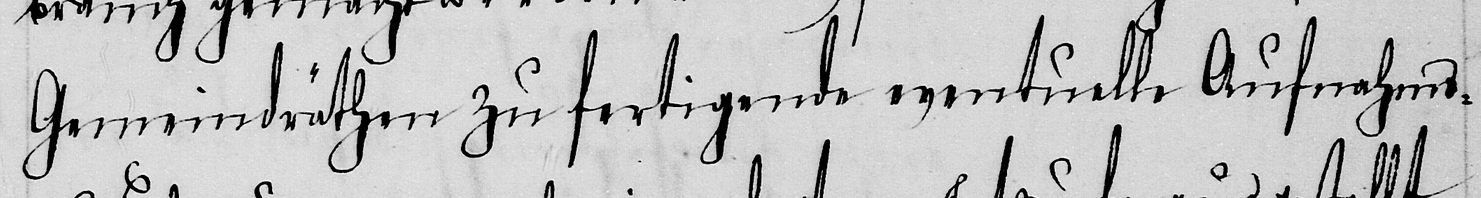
Gemeindräthen zu fertigende eventuelle Aufnahms¬
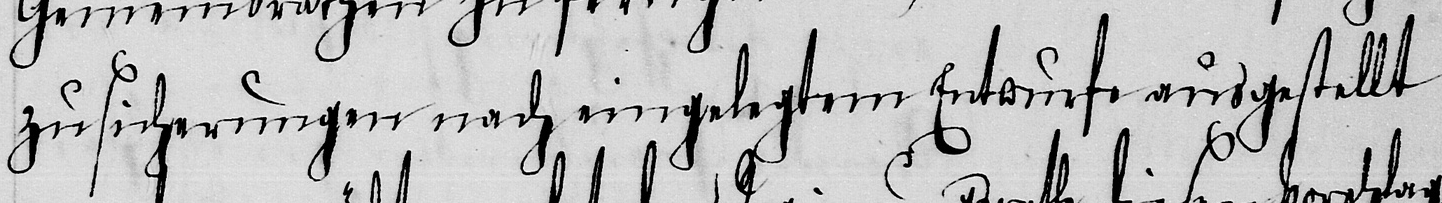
zusicherungen nach eingelegtem Entwurfe ausgestellt
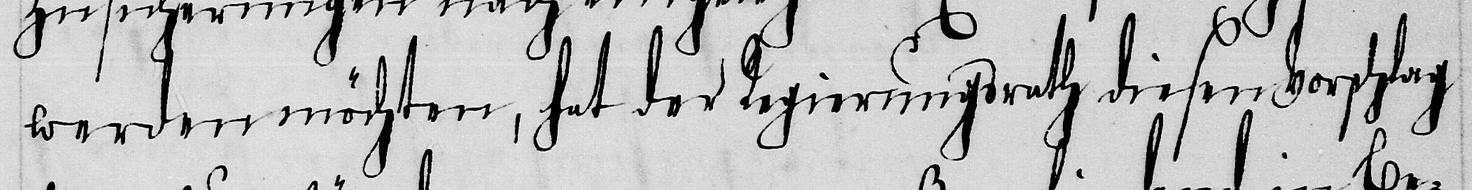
werden möchten, hat der Regierungsrath diesen Vorschlag
